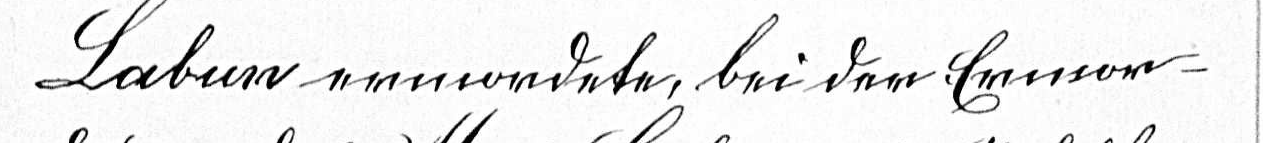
Labun ermordete, bei der Ermor¬
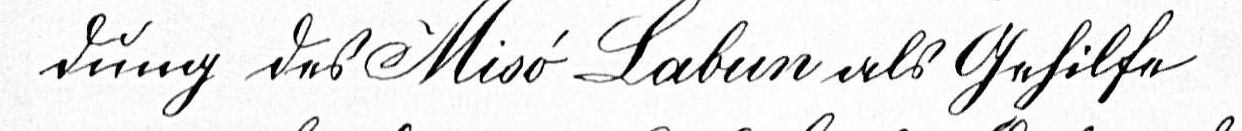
dung des Misó Labun als Gehilfe
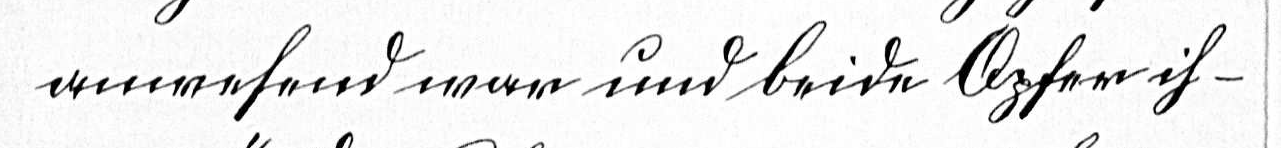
anwesend war und beide Opfer ih¬
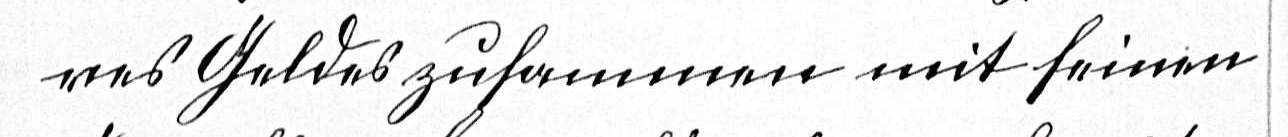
res Geldes zusammen mit seinen
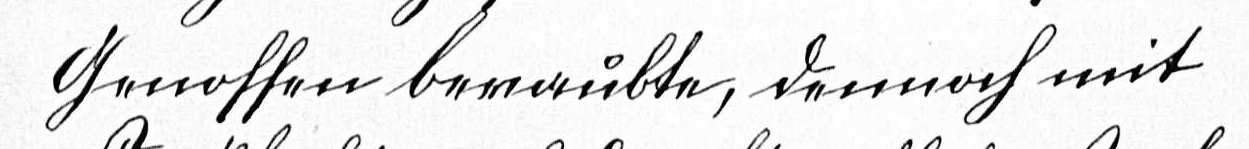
Genossen beraubte, dennoch mit
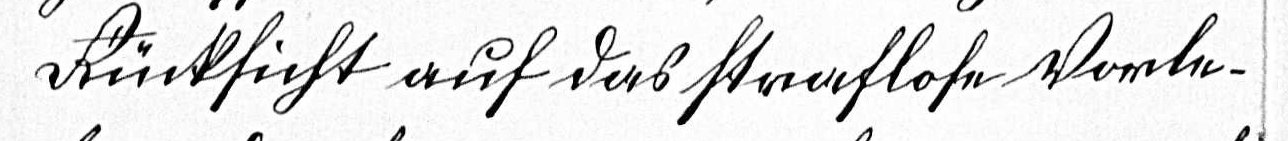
Rücksicht auf das straflose Vorle¬
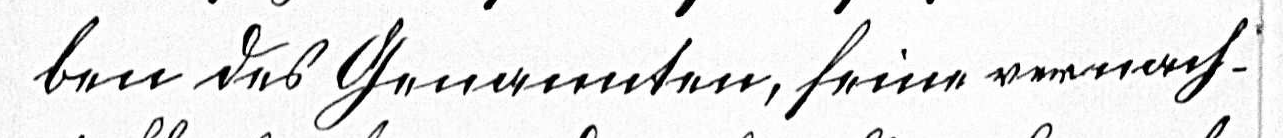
ben des Genannten, seine vernach¬
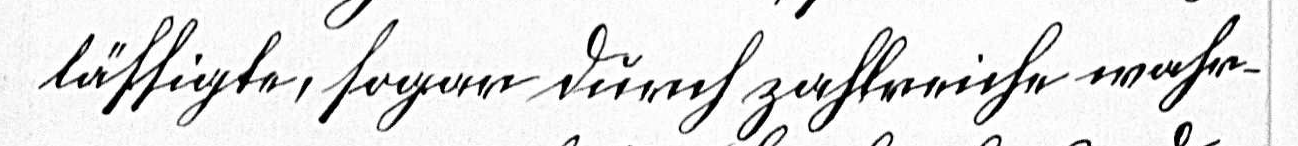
lässigte, sogar durch zahlreiche wahr¬
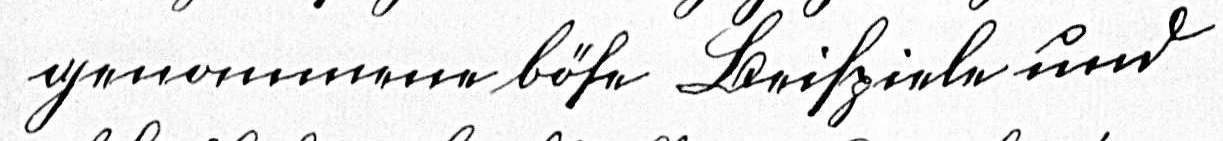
genommene böse Beispiele und
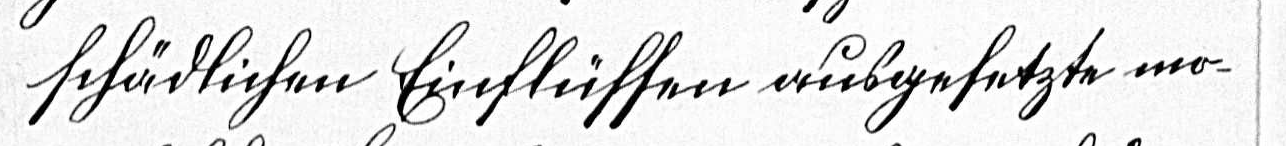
schädlichen Einflüssen ausgesetzte mo¬
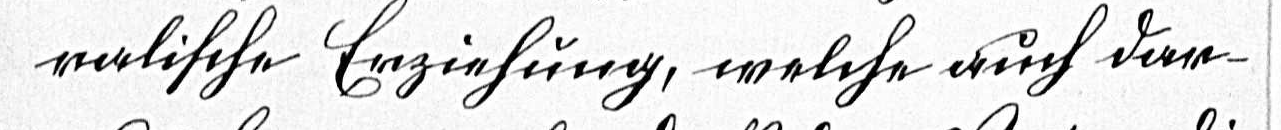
ralische Erziehung, welche auch dar¬
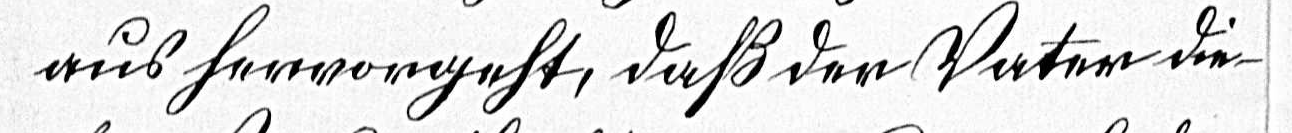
aus hervorgeht, daß der Vater die¬
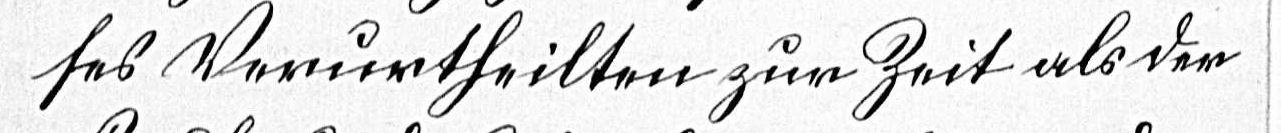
ses Verurtheilten zur Zeit als der
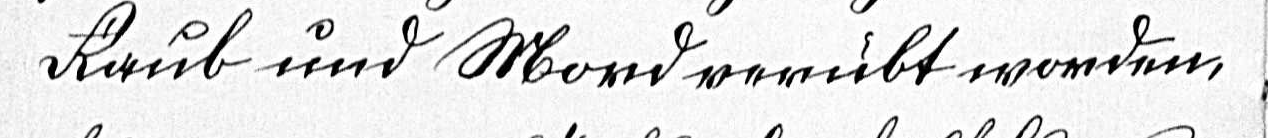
Raub und Mord verübt worden,
